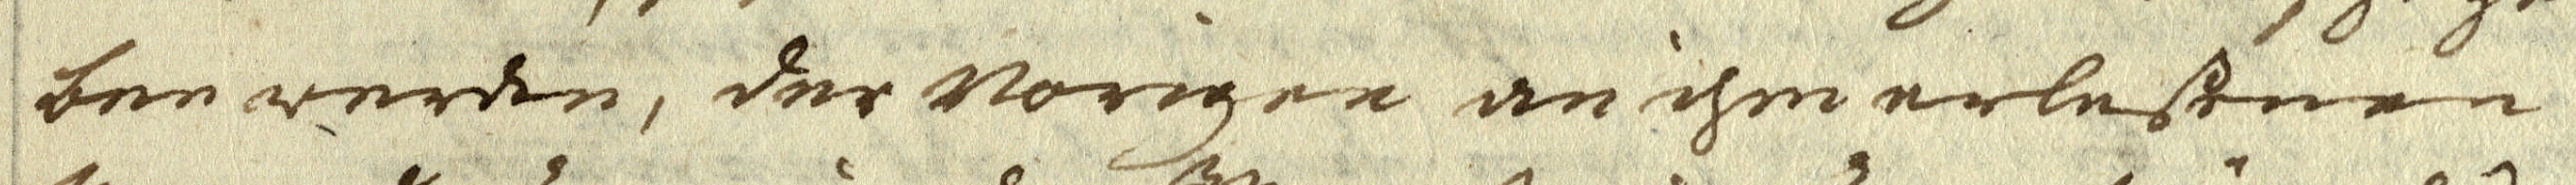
ben werden, der vorigen an ihm verlaßenen
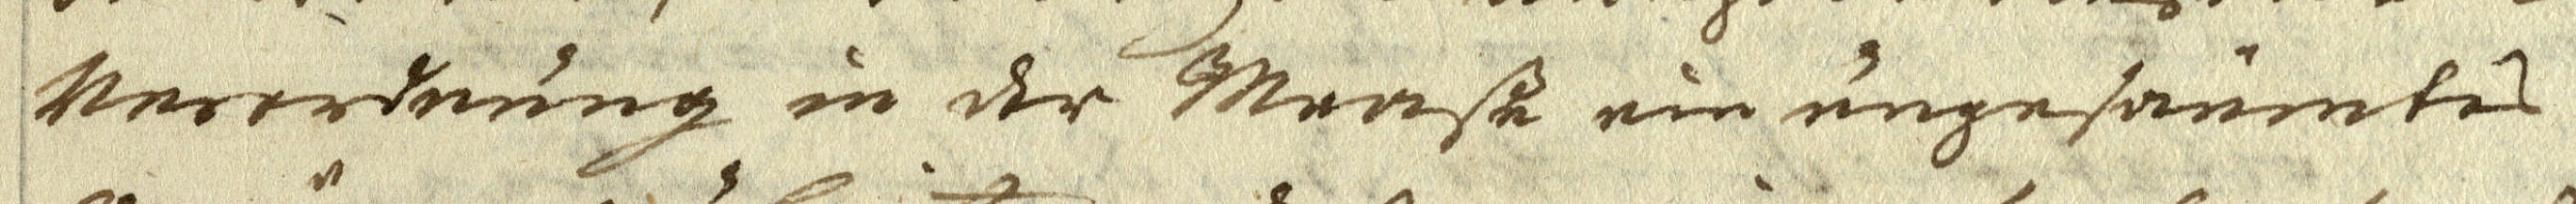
Verordnung in der Maaße ein ungesäumtes
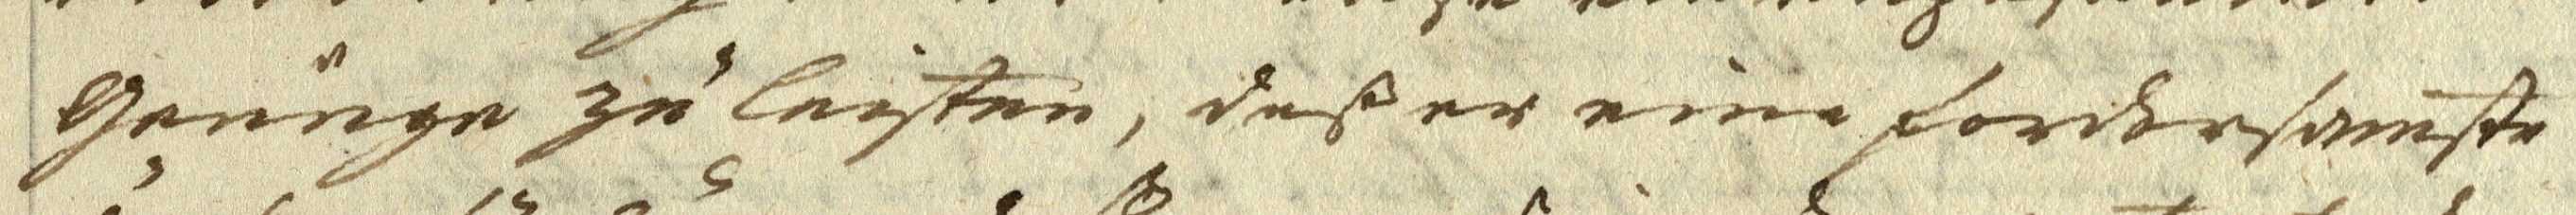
Genüge er leisten, daß er eine fordersamste
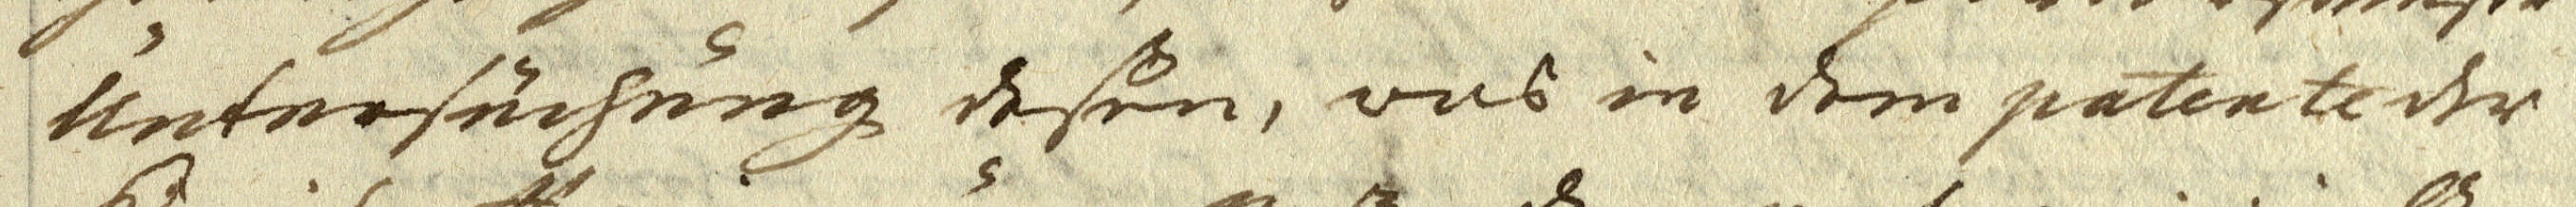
Untersuchung deßen, was in dem patente der
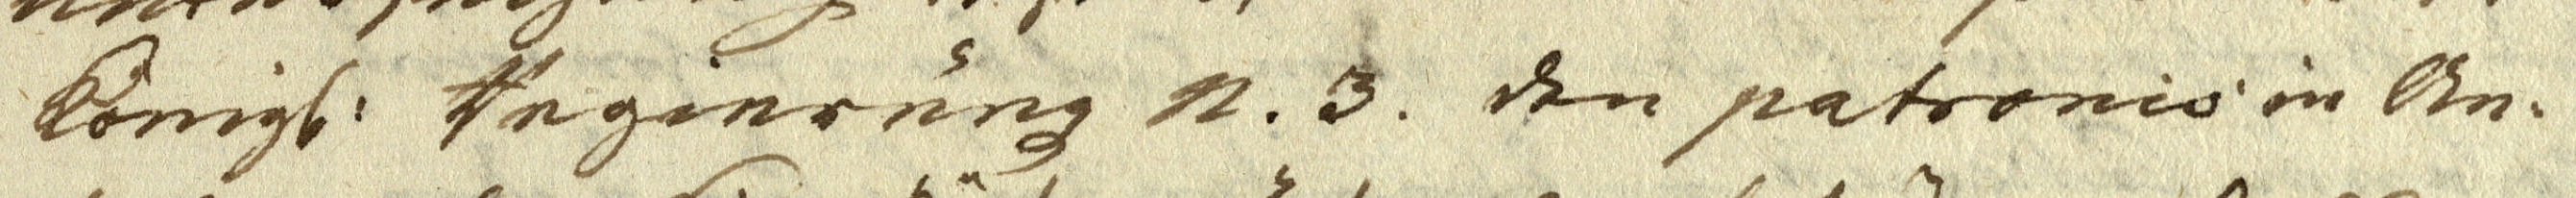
Königl. Regierung N. 3. den patronis in An¬
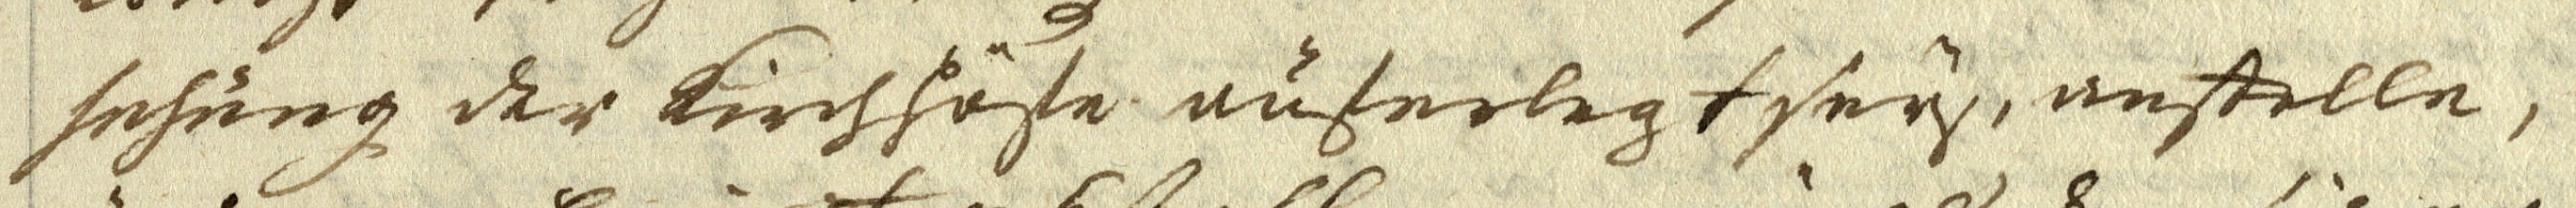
sehung der Kirchhöfe auferlegt seÿ, anstelle,
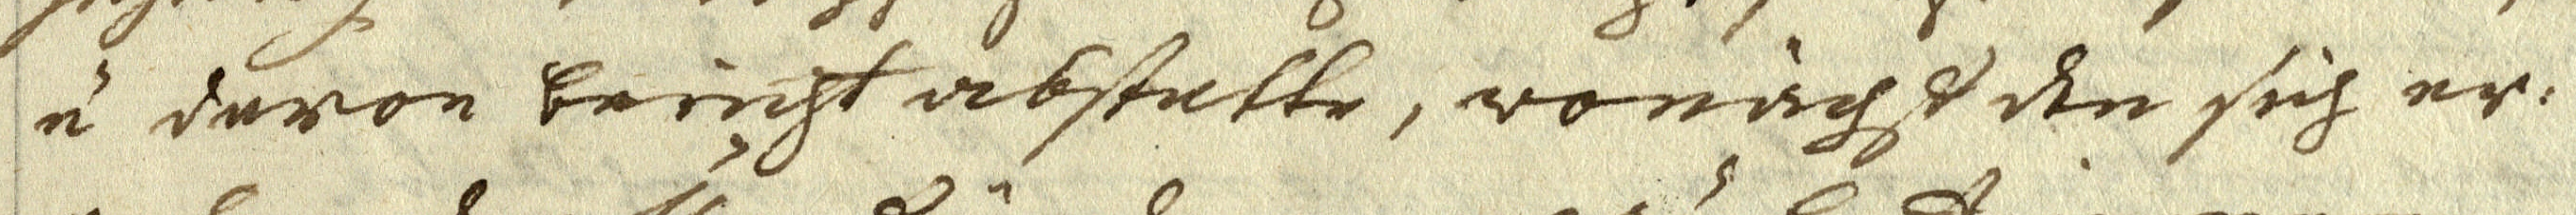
u davon Bericht abstatte, wonächst den sich er¬
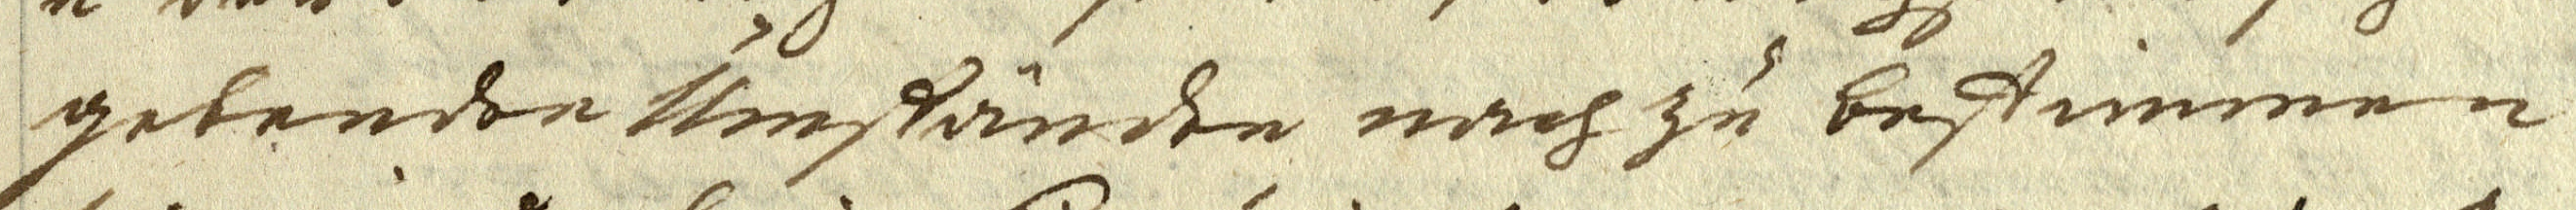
gebenden Umständen nach zu bestimmen
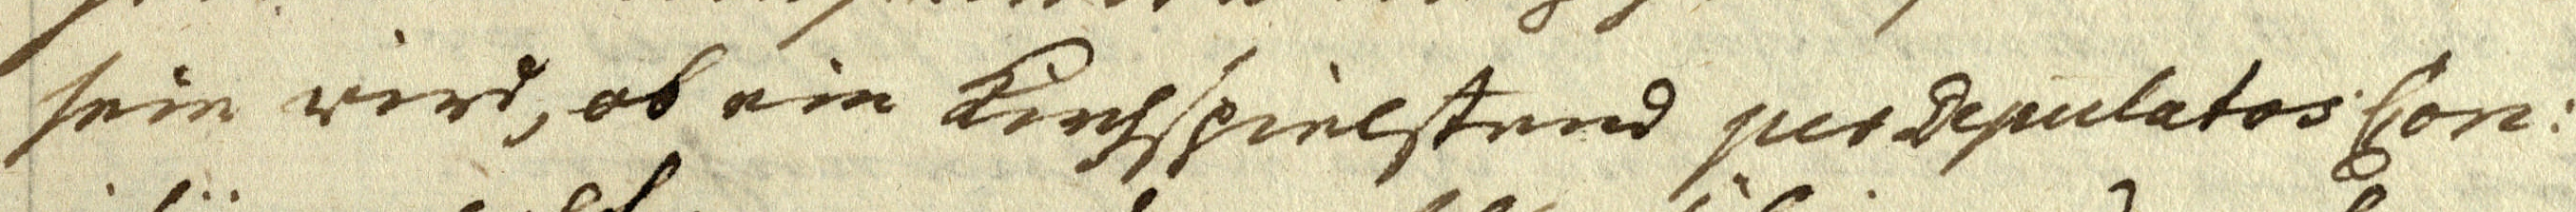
sein wird, ob ein Kirchspielstand per Deputatos Con¬
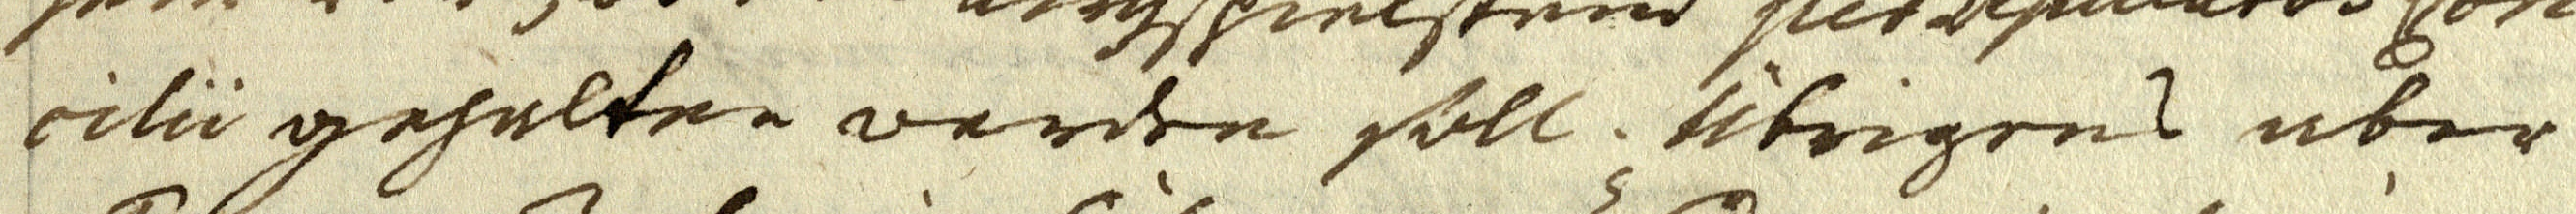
cilii gehalten werden soll. Übrigens aber
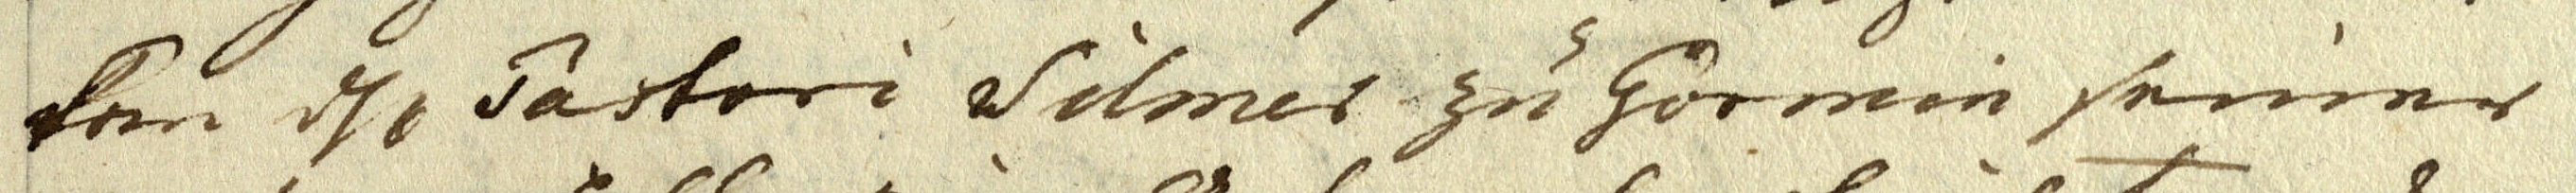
kan dh Pastori Silmer zu Görmin seiner
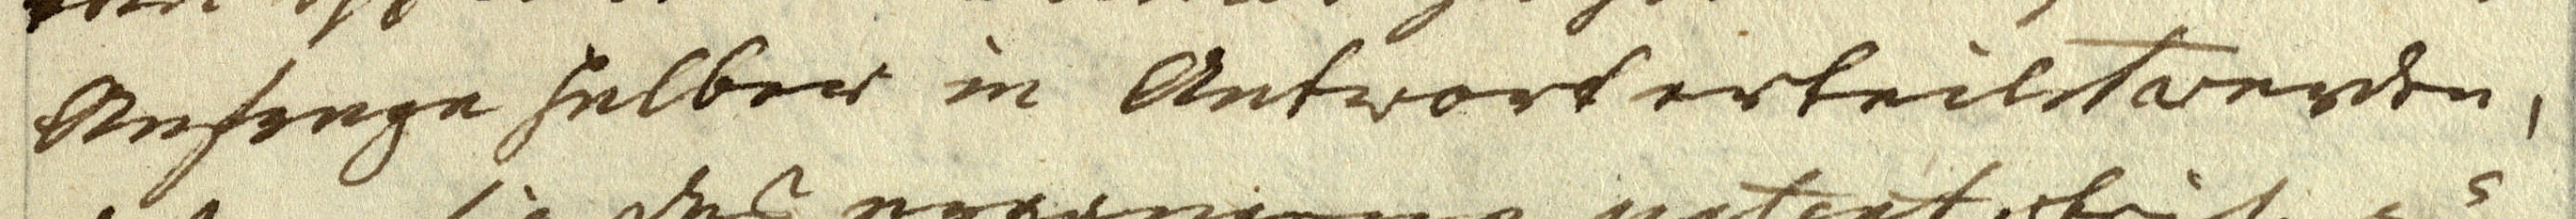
Anfrage halber in Antwort erteilt werden,
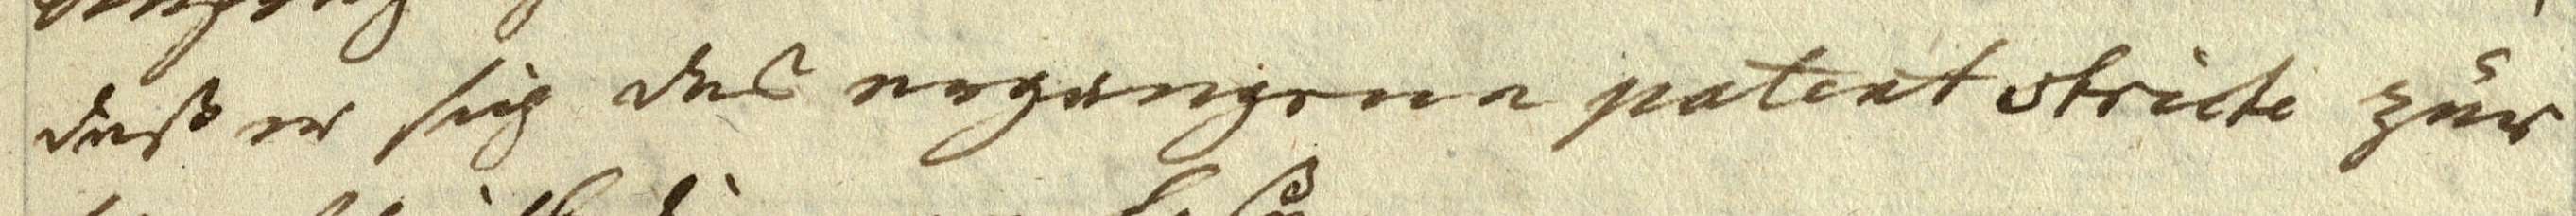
daß er sich das ergangene patent stricte zur
